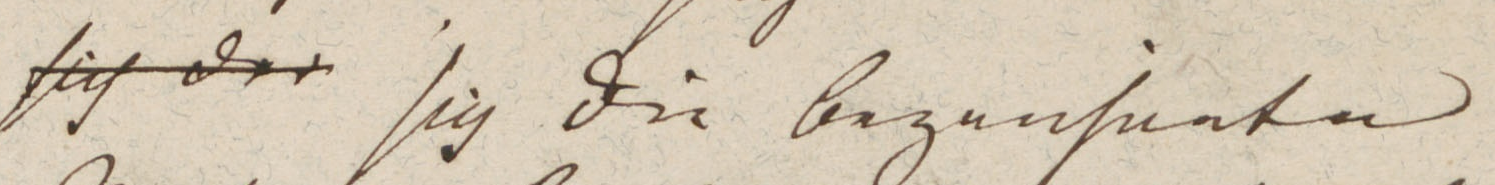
sich der sich die bezeichnete
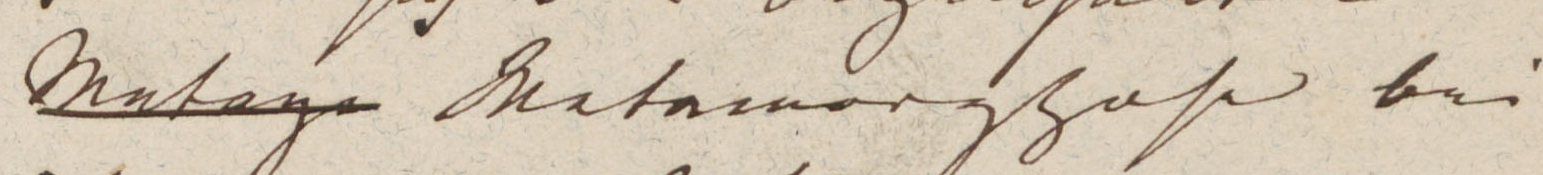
Metap Metamorphose bei
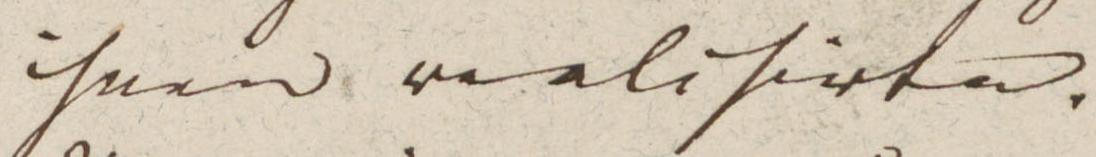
ihnen realisirte.
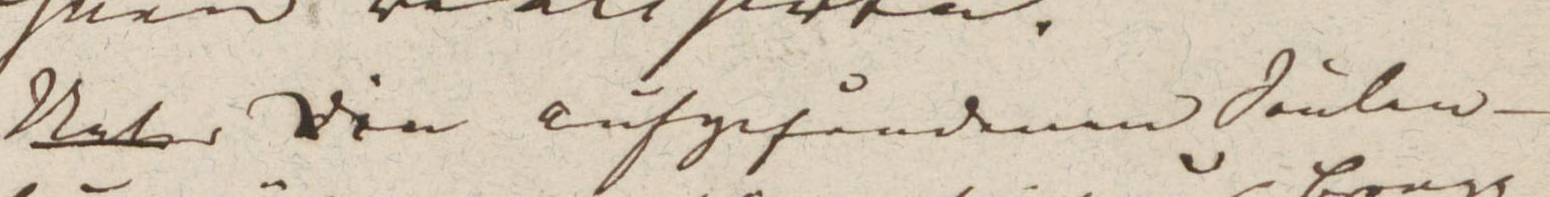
Unter denDie aufgefundenen Säulen-
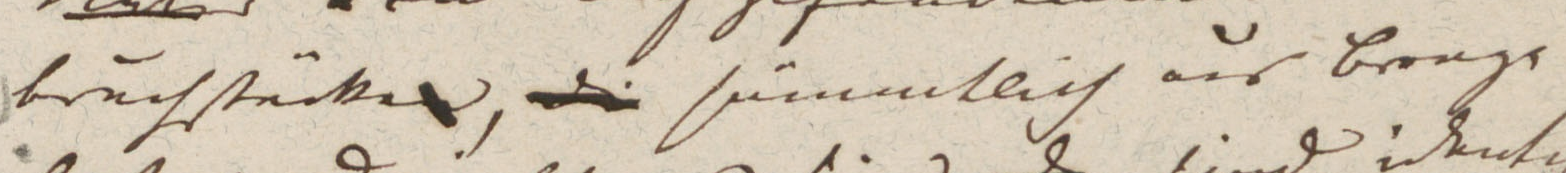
bruchstücken, die sämmtlich aus Bronze
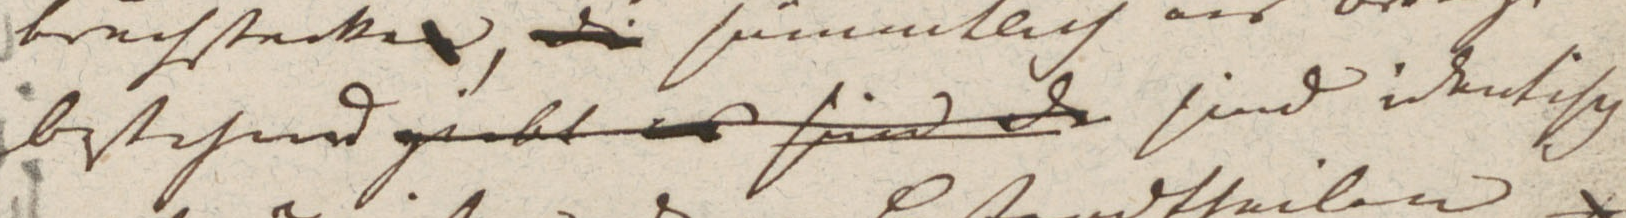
bestehend giebt es sind di sind identisch
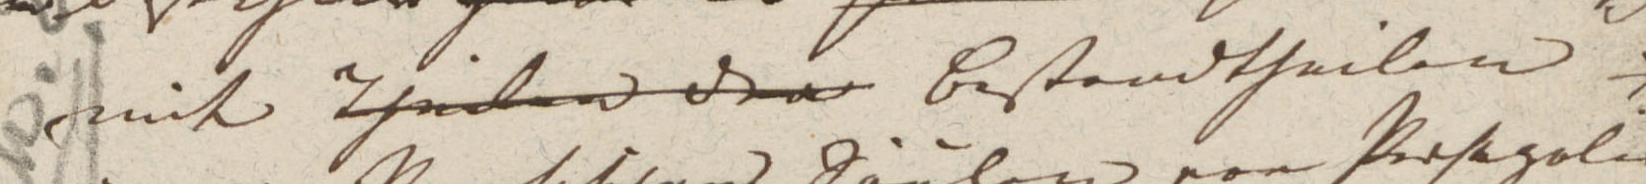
mit Theilen der Bestandtheilen
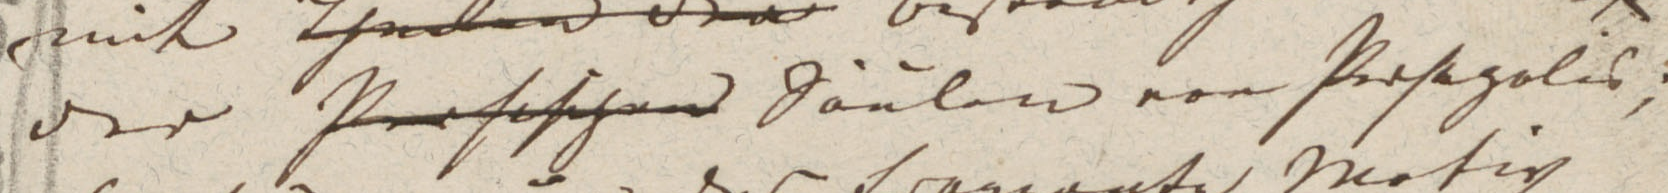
der Persischen Säulen von Persepolis; %
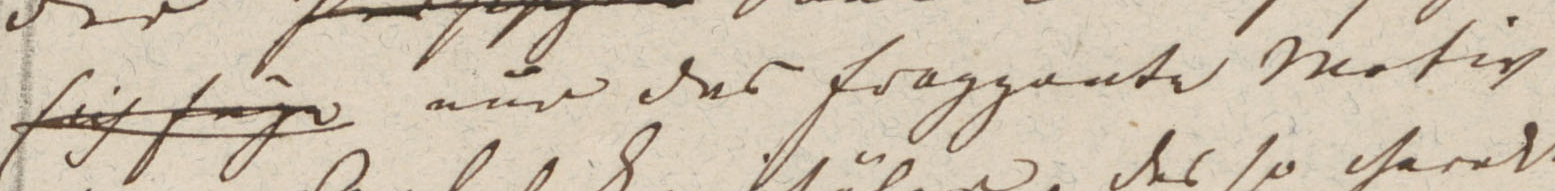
sich seyn nur das frappante Motiv
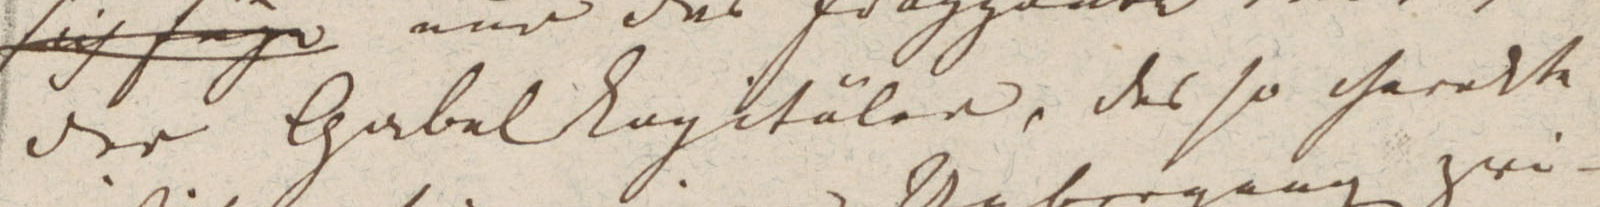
der Gabelkapitäler, das so charakte-
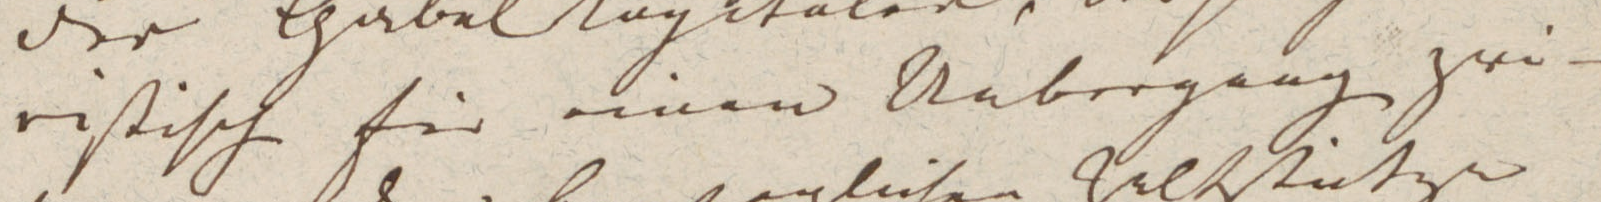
ristisch für einen Uebergang zwi-
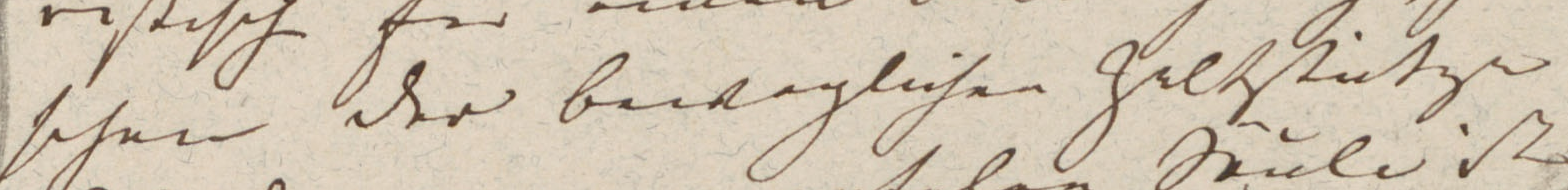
schen der beweglichen Zeltstütze
